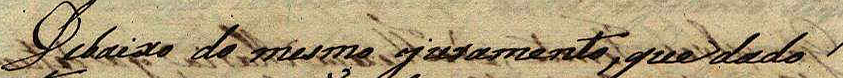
Debaixo do mesmo juramento, que dado
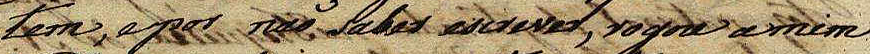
tem, e por naõ saber escrever, rogou a mim
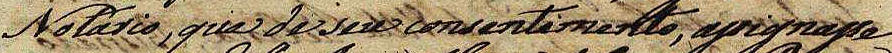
Notario, que de seu consentimento, assignasse
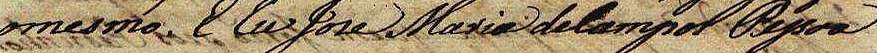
o mesmo. E eu Joze Maria de Campos Pessoa
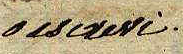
o escrevi.
